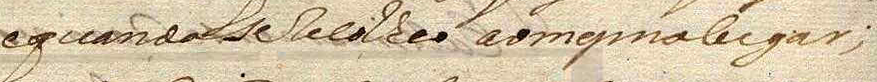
e quando se Recolheo ao mesmo lugar;
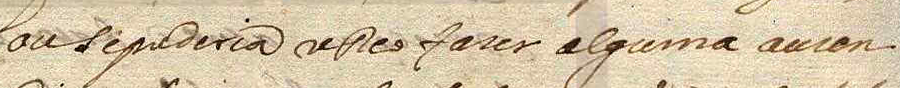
ou se puderia o Reo fazer alguma auzen
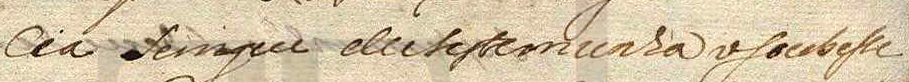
cia sem que elle testemunha o soubesse
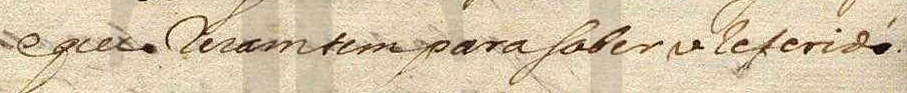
e que Rezam tem para saber o Referido.
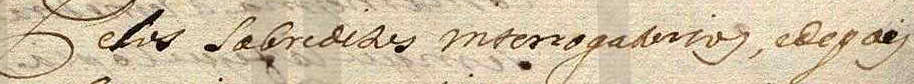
Pelos sobreditos interrogatorios, e depois
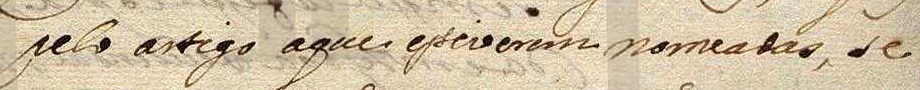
pelo artigo a que estiverem nomeadas, se
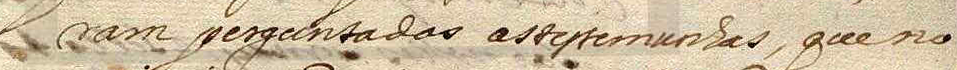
ram perguntadas as testemunhas, que no
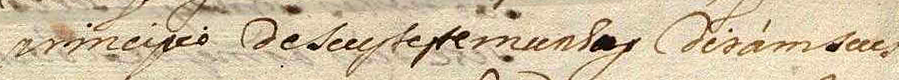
principio de seus testemunhos dirám seus
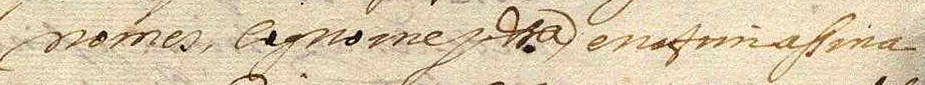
nomes, cognomes &ra, e no fim assina
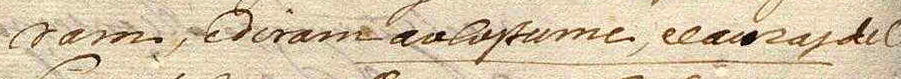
ram, e diram ao costume e cauzas del
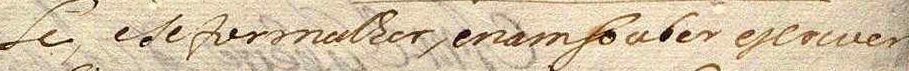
le e se for mulher, e nam souber escrever
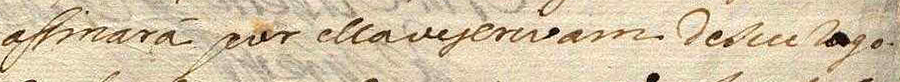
assinará por ella o escrivam de seu Rogo
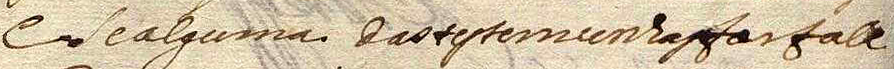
e se alguma das testemunhas for fale
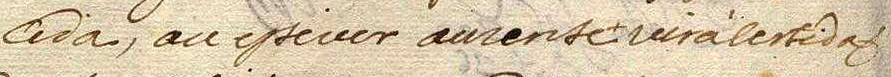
cida, ou estever auzente virá certidaõ
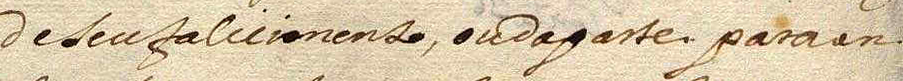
de seu falecimento, ou da parte para on
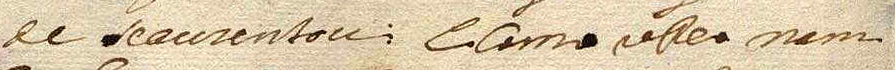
de se auzentou: e como o Reo nam
